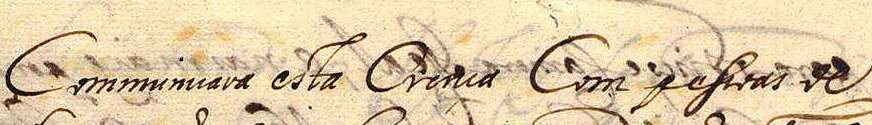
Communicava esta Crença Com pessoas de
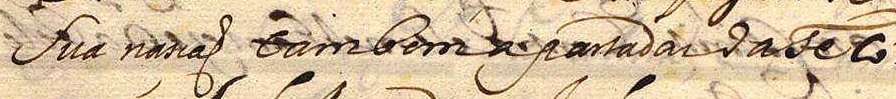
Sua nasçaõ tambem apartadas da Fe cō
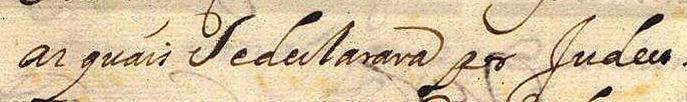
as quais Se declarava por Judeu.
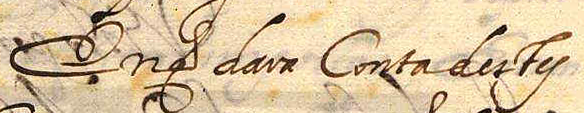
E naõ dava Conta destes
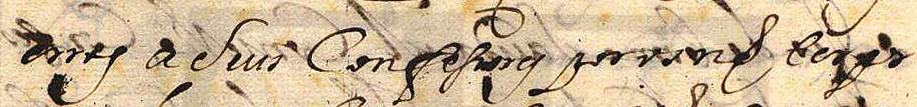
erros a Seus Confessores por os naõ ter por
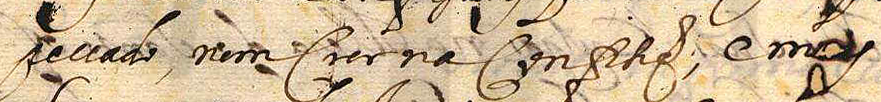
peccado, nem Crer na Confissaõ, e m_s
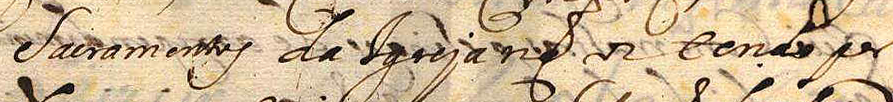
Sacramentos da Igreja naõ os tendo por
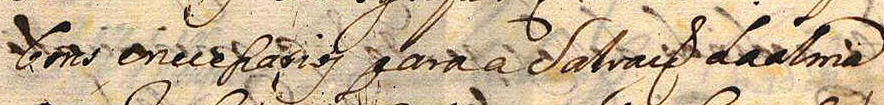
bons e necessarios para a Salvaçaõ da alma
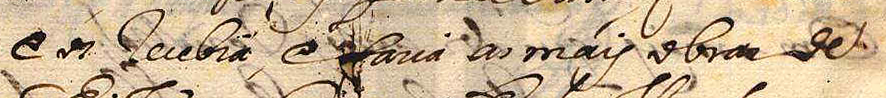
e os Recebia e fazia as mais obras de
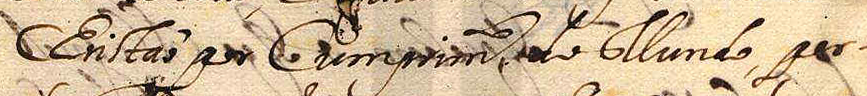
Christaõ por Cumprim.to do Mundo, per
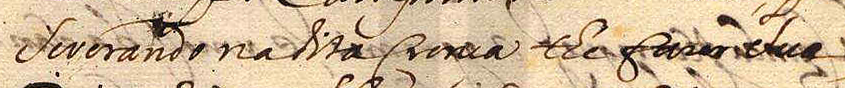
severando na dita Crença thé fazer Sua
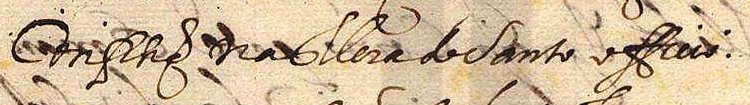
Confissaõ na Meza do Santo officio.
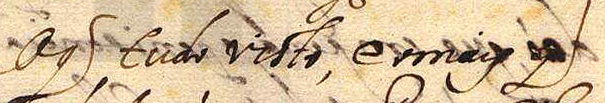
O q̄ tudo visto, e o mais q̄
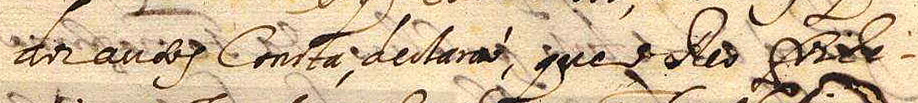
dos autos Consta, declaraõ, que o Reo foi he
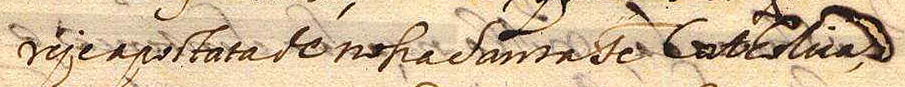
reje apostata de nossa Santa Fe Catholica,
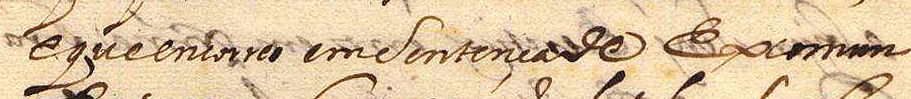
e que encorreo em Sentença de Excomun
